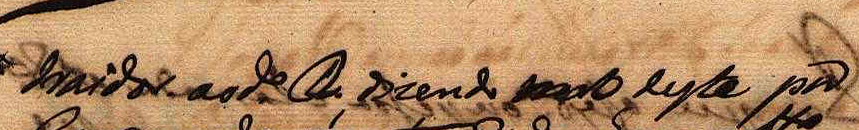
traidor ao d.o R. dizendo mal deste por
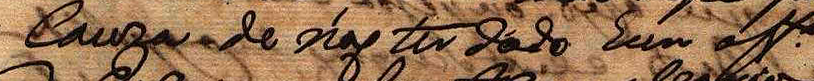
cauza de naꝭ ter dádo hum off.o
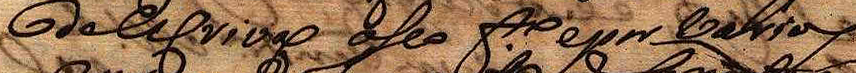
de EsCrivaꝭ a seo f.o e por varios
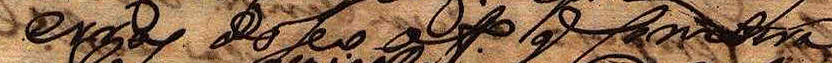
erros do seo off.o q̄ Cometera
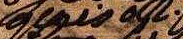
quis o R.
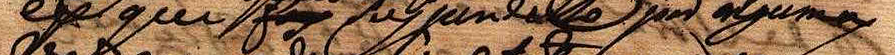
e plo que foy suspendello por algumas
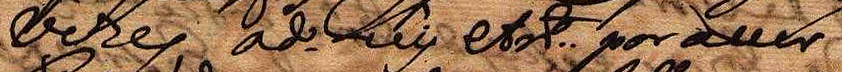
vezes, o do Luis An.to por o uer
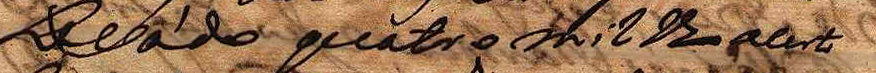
Levado quatro mil rz a certo
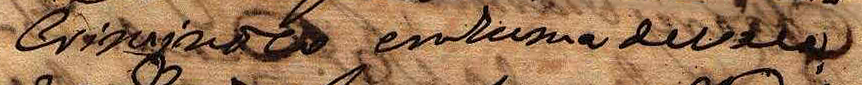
Criminozo em huma devaça,
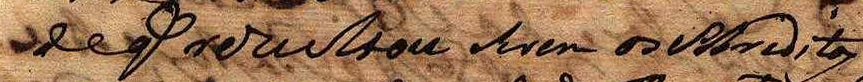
de q̄ rezultou serem os Sobreditos
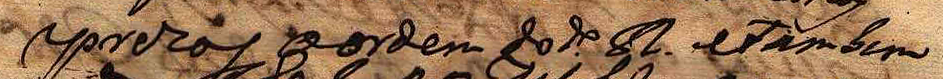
prezos a ordem do d.o R. e tambem
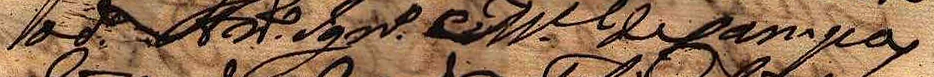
o d.o An.to Ign.o e M.el de Campos
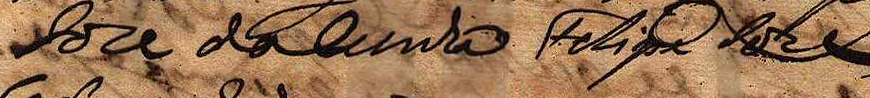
Ioze da Cunha Felipe Ioze
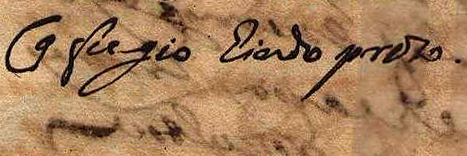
q̄ fugio hindo prezo.
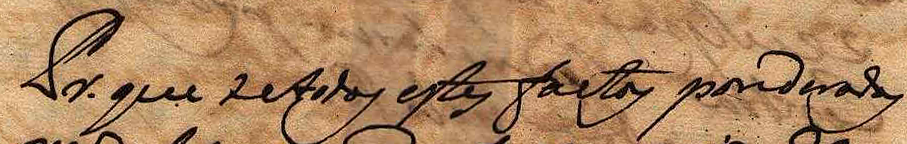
Pr. que de todos estes factos ponderados
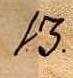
i3.
